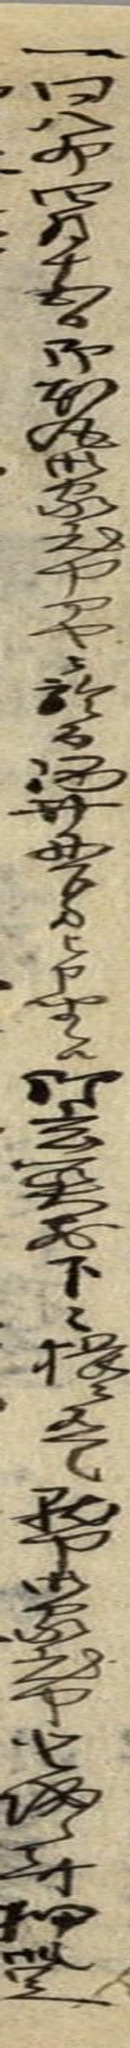一同八卯四月十五日御本丸御家老中部やに於て酒井丹下方被申聞候は御玄関前下々猥に有之就中御家老中登城候刻御押之御足
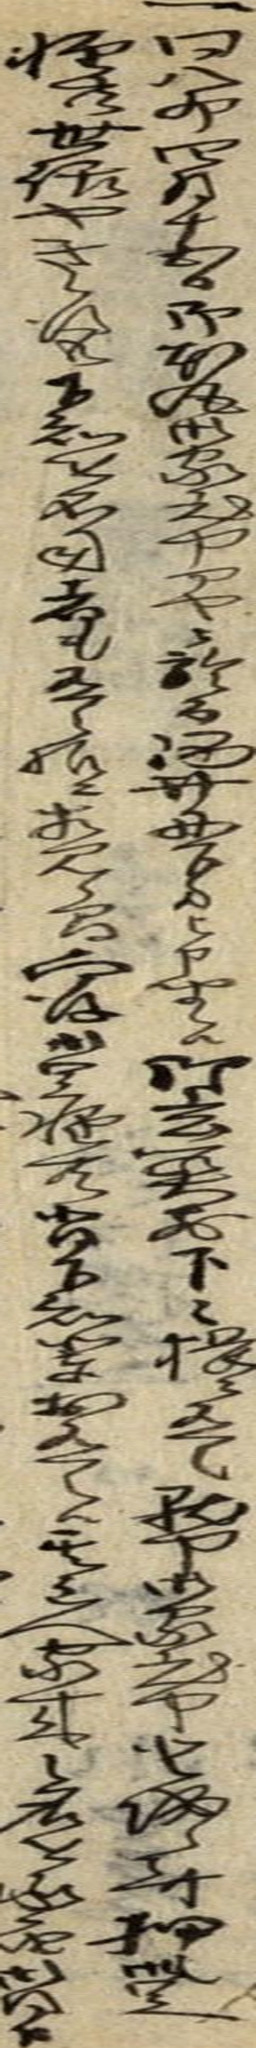軽共世話やき候得共下知を不用者も有之様に相見候間向後御足軽共背下知輩於有之は其主人家来之名を承届御目付
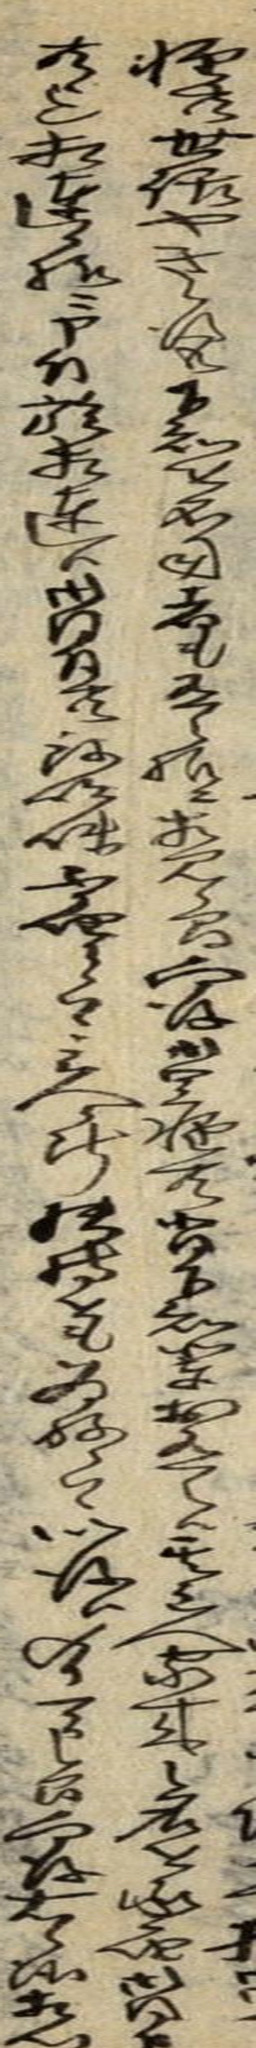共迄相達候様に申付於相達候御目付共致吟味不届に候はゝ主人に断扶持をも為改候はゝ以後は〆り可申候間向後右之趣相心
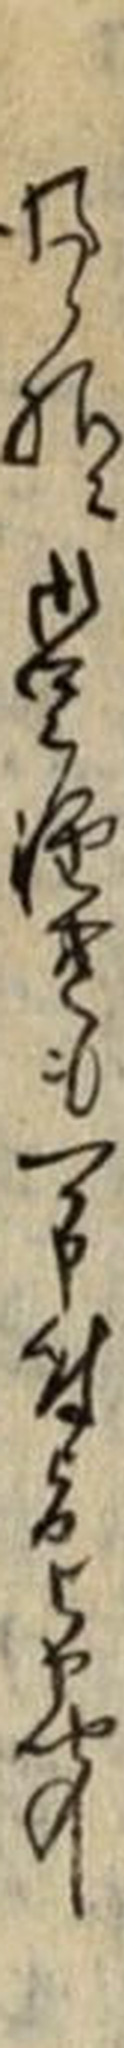得候様に御足軽共へも可申付旨被申聞候
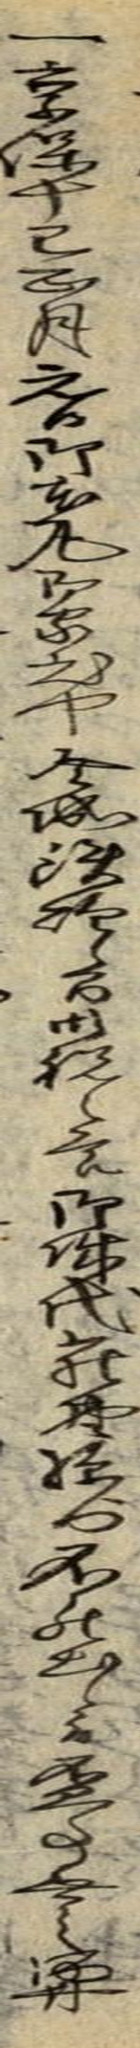一享保十巳正月元旦御本丸御家老中登城鉄砲之間御祝之節御城代荻野孫右衛門不罷出候に付盃事無之酒井
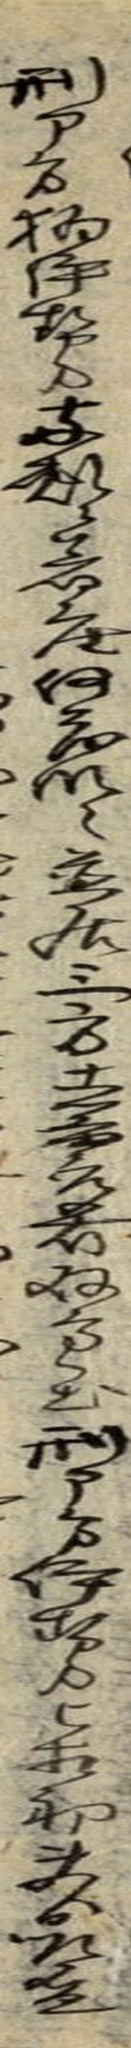刑部方狛伊勢方両頬に着座何も段々並居三方土器取肴双方へ出刑部方伊勢方被相勤其ゟ頂盃
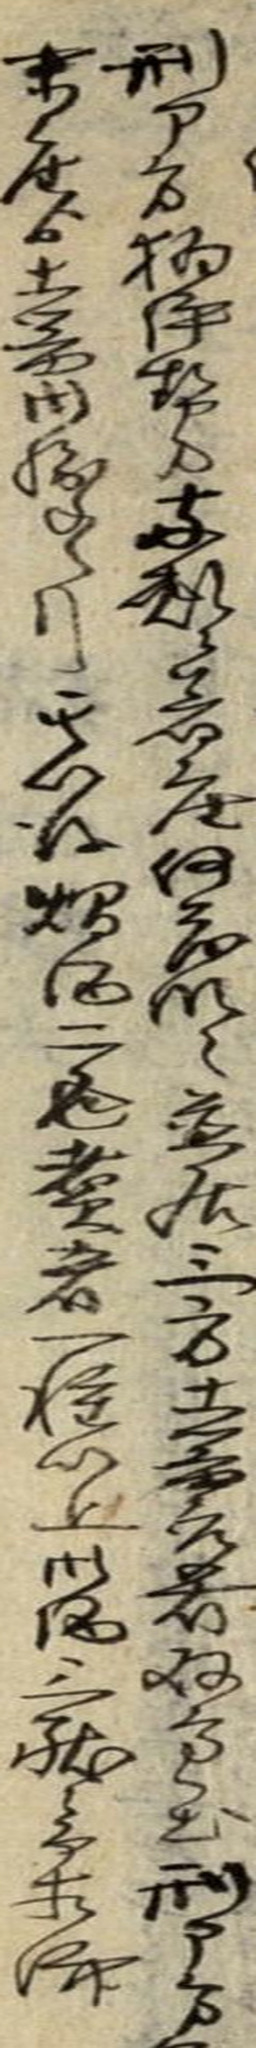末座ゟ土器御勝手へ引其以後燗酒二返煮肴一種以上御酒三献に而相済
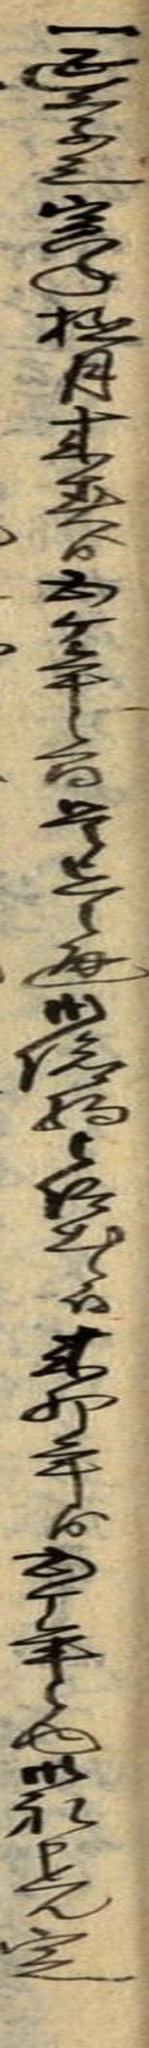一延享三寅年極月来春ゟ五ヶ年之間是迄之通御倹約被仰出候に付來卯年ゟ五ヶ年之内御礼申上る定
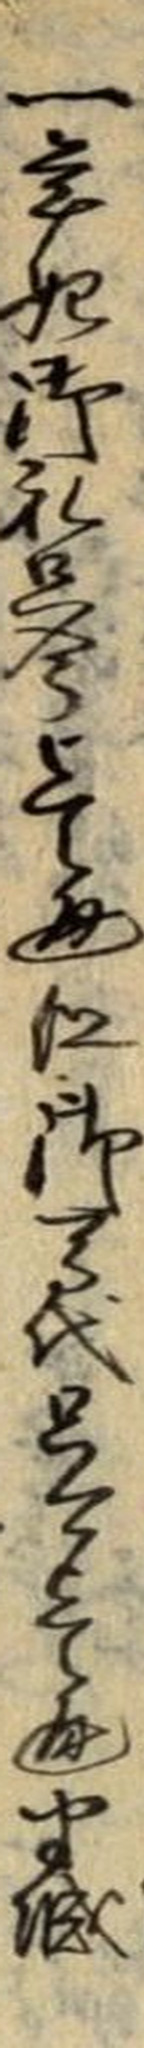一年始御礼只今迄之通但御馬代只今迄之通半減
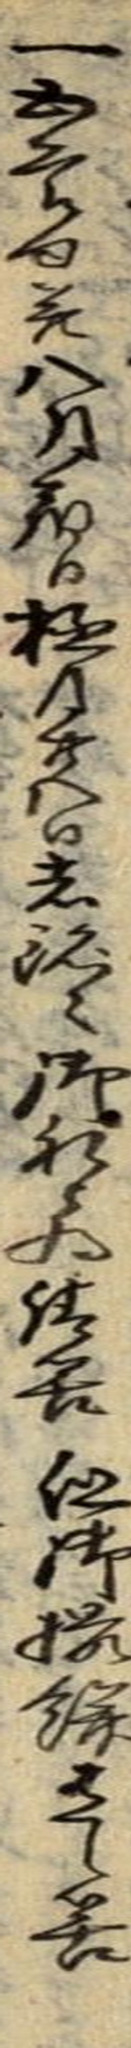一五節句并八月朔日極月廿八日は銘々御礼被為請候筈但御粽餅有之筈
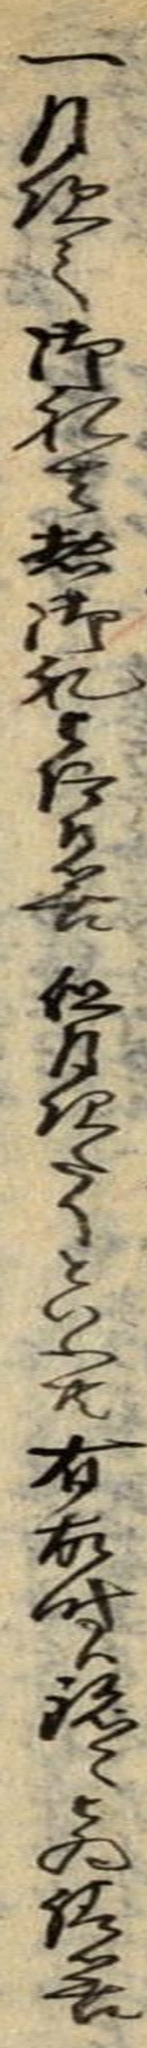一月次之御礼は惣御礼被仰付候筈但月次たりといふ共有故時は銘々被為請候筈
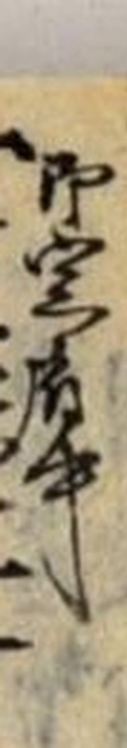御定府中
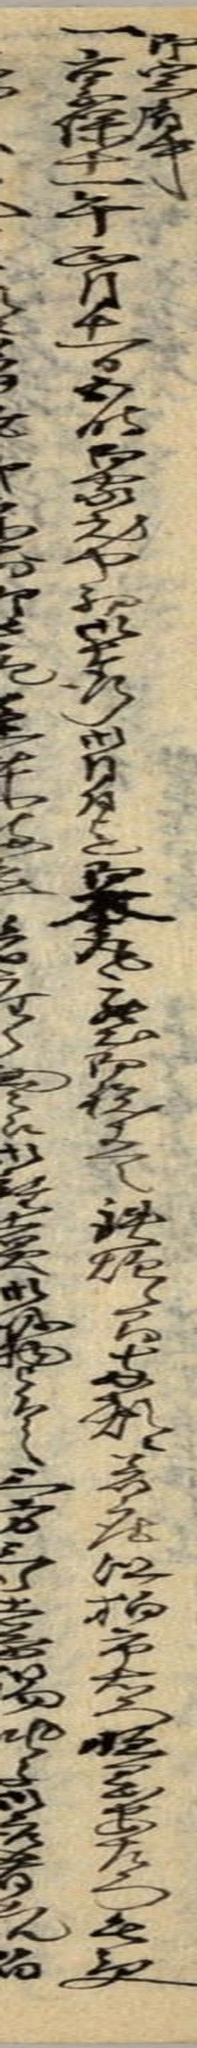一享保十一午正月十一日五時御家老中初御奉行御目付迄御本丸へ罷出御祝有之鉄砲之間両頬へ着座但狛市右衛門恒岡安左衛門毛受
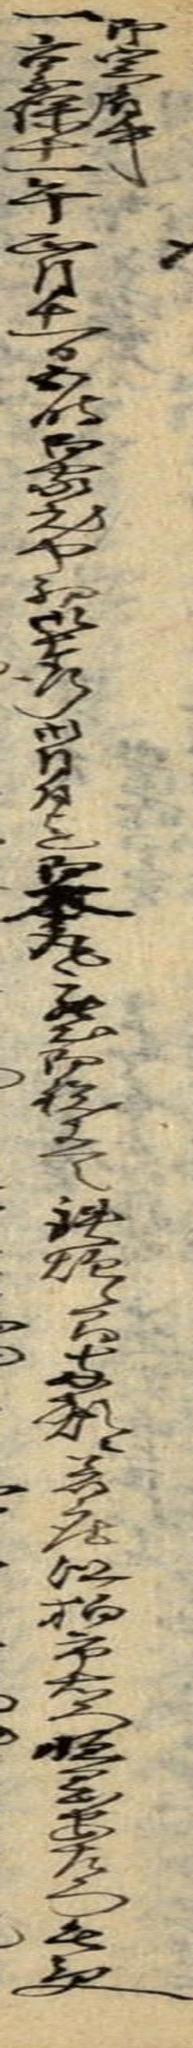一享保十一午正月十一日五時御家老中初御奉行御目付迄御本丸へ罷出御祝有之鉄砲之間両頬へ着座但狛市右衛門恒岡安左衛門毛受
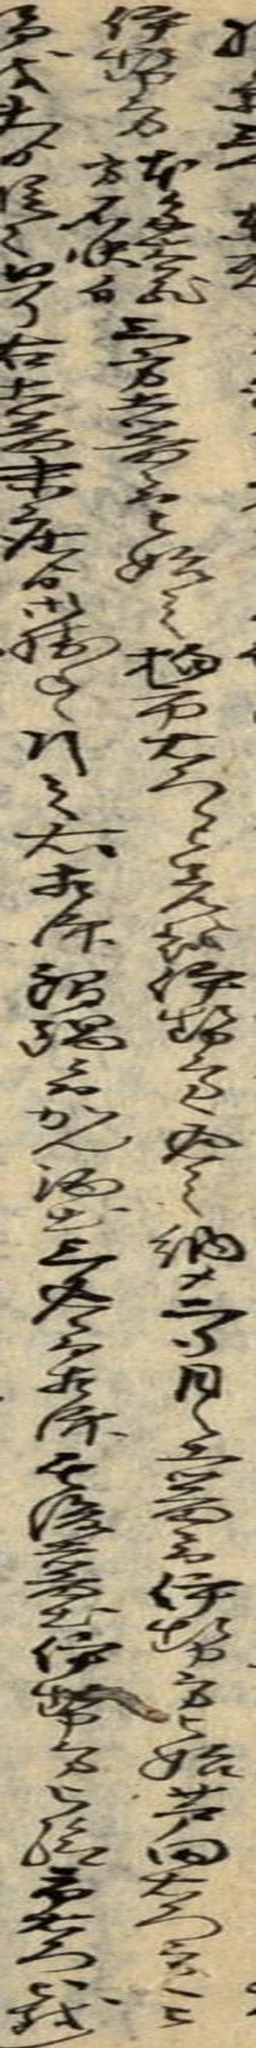指越夫ゟ段々廻り右土器末座ゟ御勝手へ引之右相済燗鍋に而かん酒出三返に而相済其後土器出伊勢方被請市右衛門へ被越納る
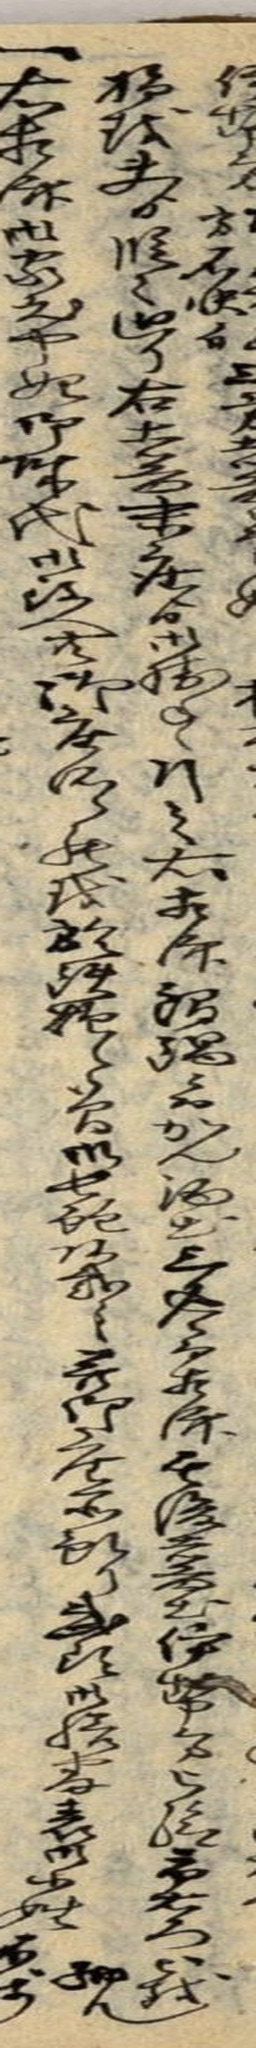一右相済御家老中始御城代御役人共御座所へ罷越於鉄砲之御間御長蚫頂戴之并御座所預り武頭御膳番表御小姓不残
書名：蒐輯之部
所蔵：福井県文書館 Fukui Prefectural Archives
